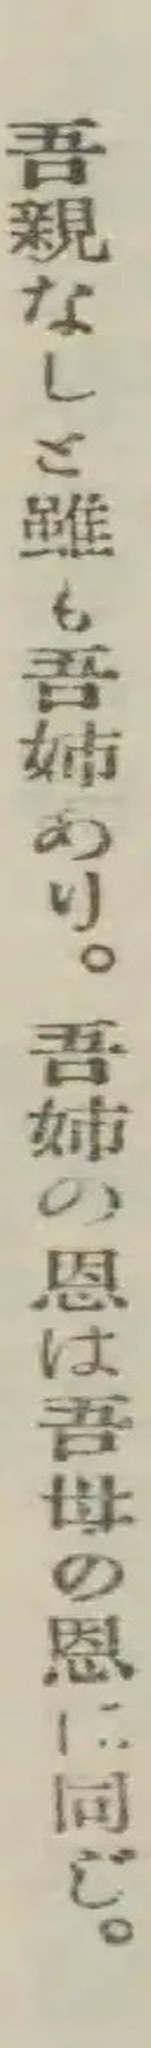吾親なしと雖も吾姉あり。吾姉の恩は吾母の恩に同じ。
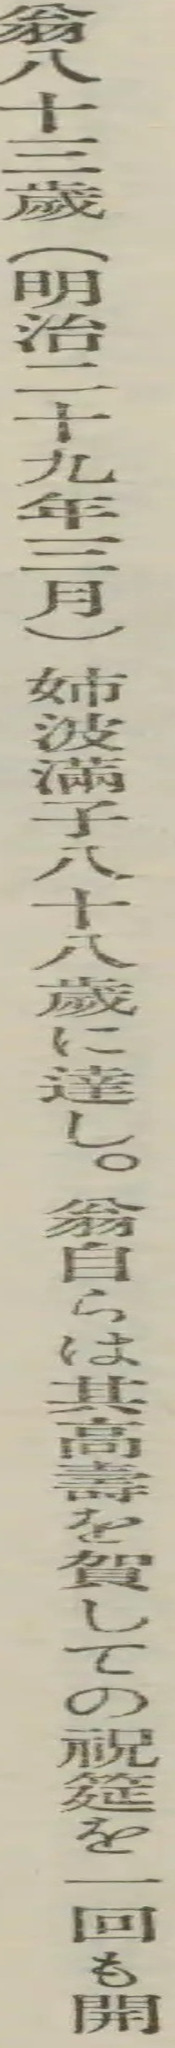翁八十三歳(明治二十九年三月)姉波満子八十八歳に達し。翁自らは其高寿を賀しての祝筵を一回も開
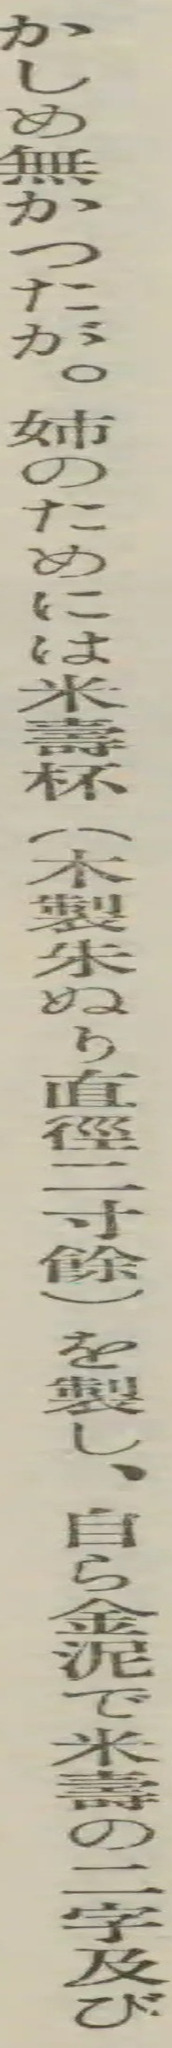かしめ無かつたが。姉のためには米寿杯(木製朱ぬり直径二寸余)を製し、自ら金泥で米壽の二字及び
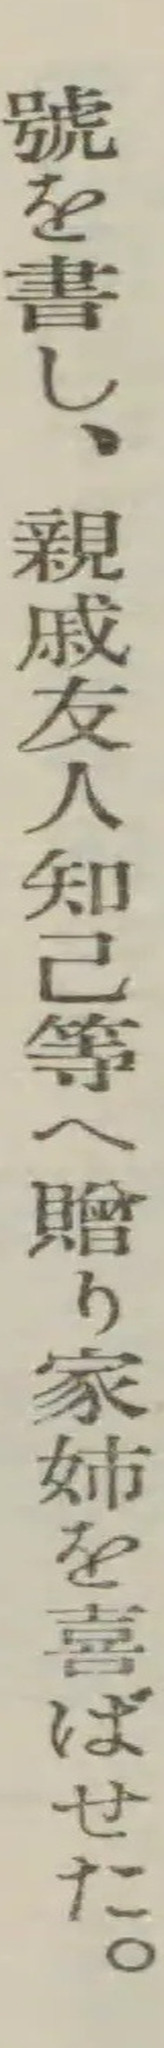号を書し、親戚友人知己等へ贈り家姉を喜ばせた。
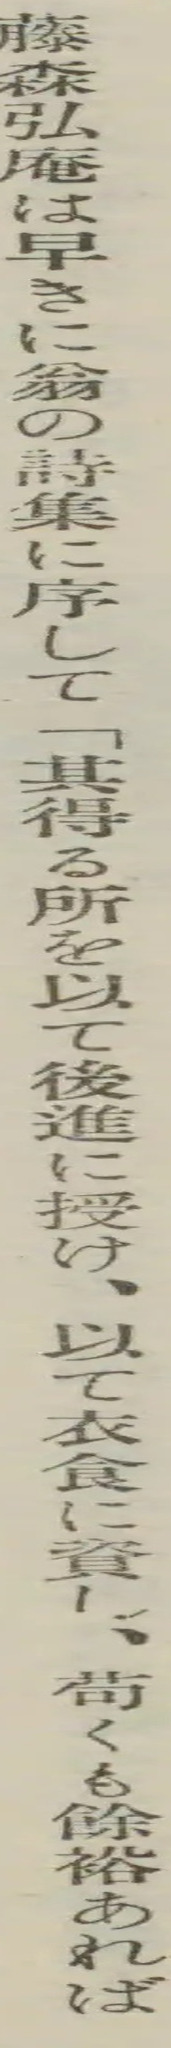藤森弘庵は早きに翁の詩集に序して「其得る所を以て後進に授け、以て衣食に貧し、苟くも余裕あれば
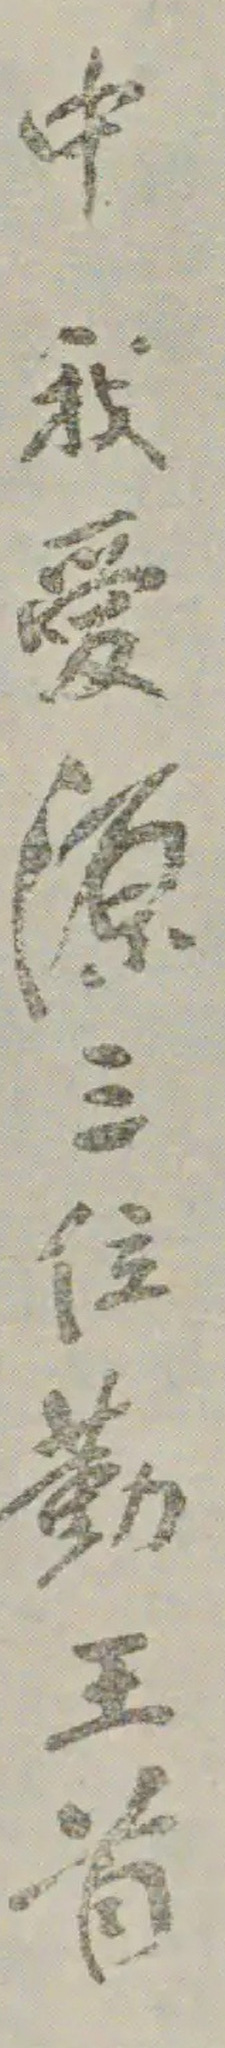中我愛源三位勤王首
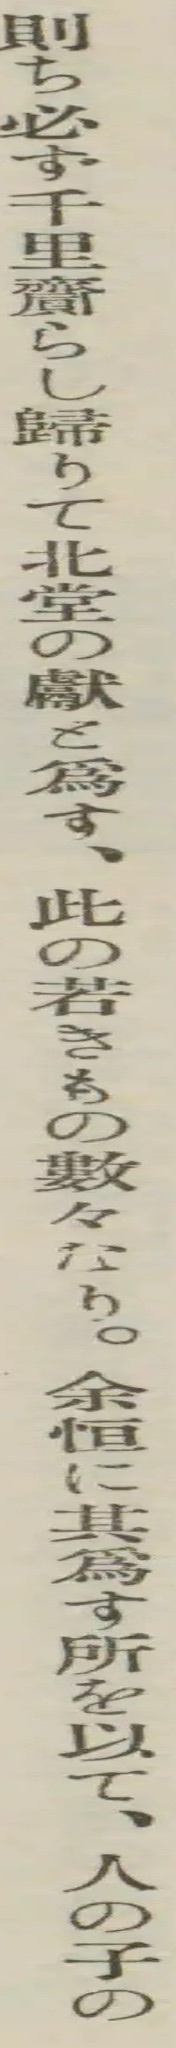則ち必ず千里齎らし帰りて北堂の献と為す、此の若きもの数々なり。余恒に其為す所を以て、人の子の
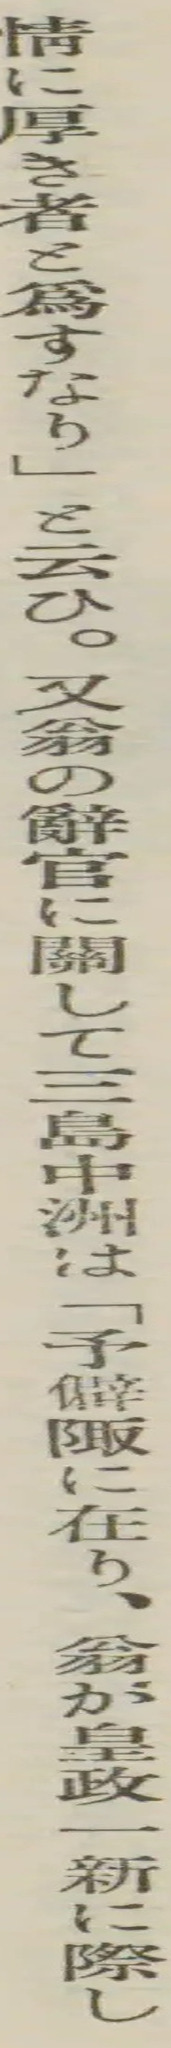情に厚き者と為すなり」と云ひ。又翁の辞官に関して三島中洲は「予僻陬に在り、翁が皇政一新に際し
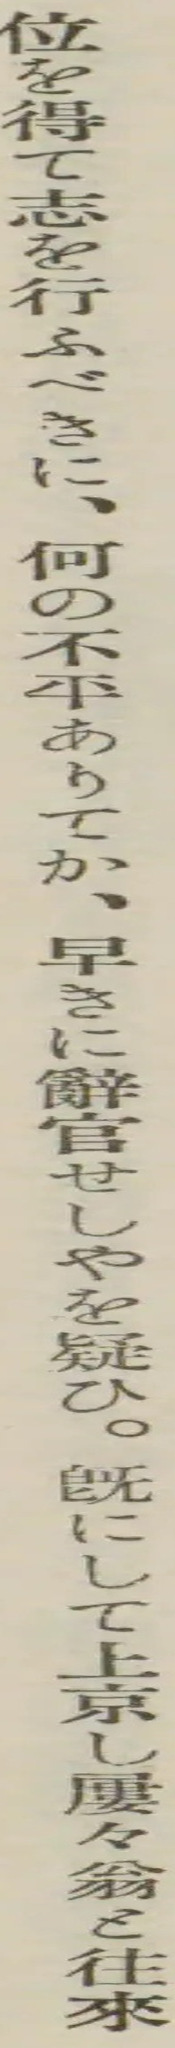位を得て志を行ふべきに、何の不平ありてか、早きに辨官せしやを疑ひ。既にして上京し屡々翁と往来
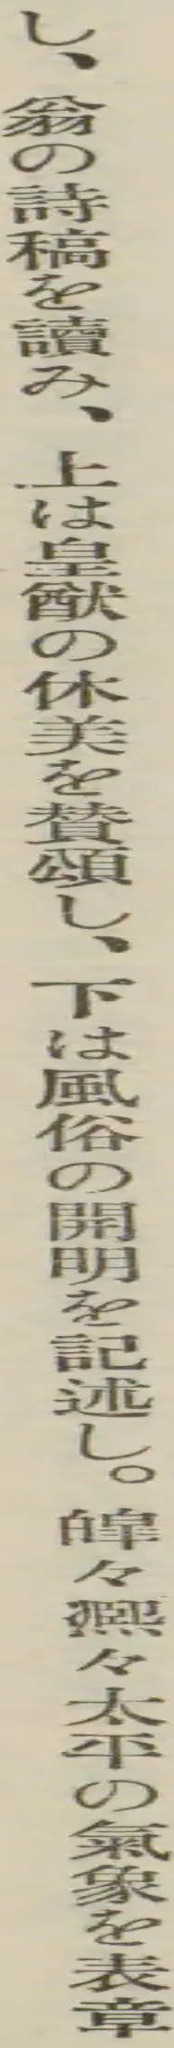し、翁の詩稿を読み、上は皇猷の休美を賛頌し、下は風俗の開明を記述し。皥々凞々太平の気象を表章

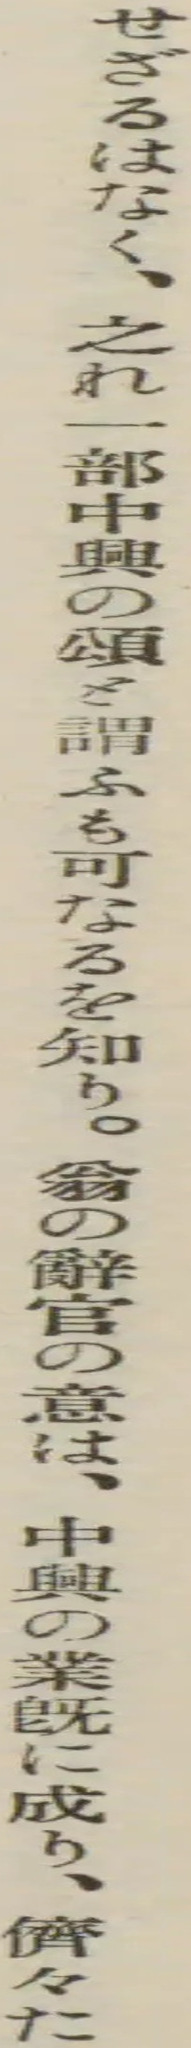せざるはなく、之れ一部中興の頌と謂ふも可なるを知り。翁の辞官の意は、中興の業既に成り、儕々た
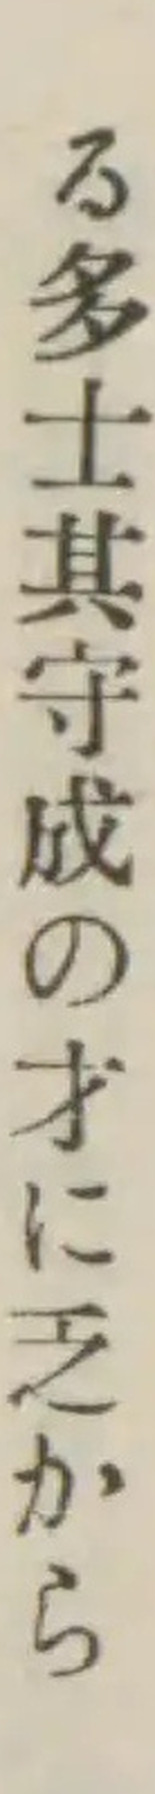る多士其守成の才に乏から
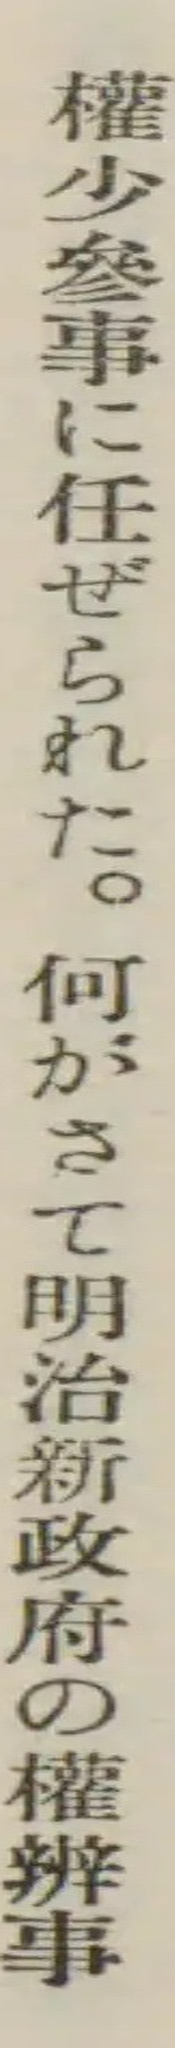権少参事に任ぜられた。何がさて明治新政府の権辨事
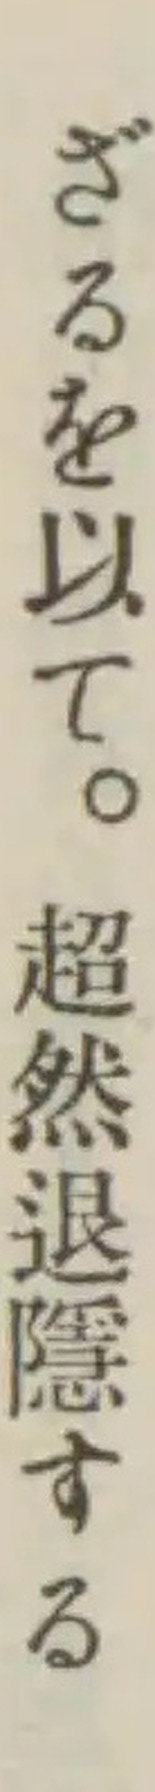ざるを以て。超然退隠する
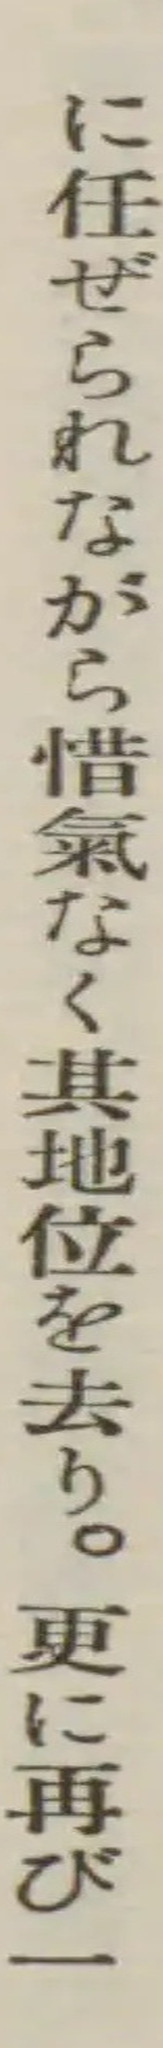に任ぜられながら惜気なく其地位を去り。更に再び一
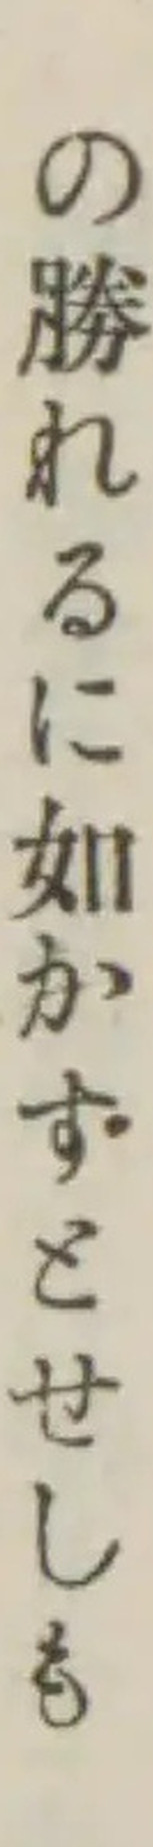の勝れるに如かずとせしも
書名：小野湖山翁小伝
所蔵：国立国会図書館 National Diet Library, JAPAN
